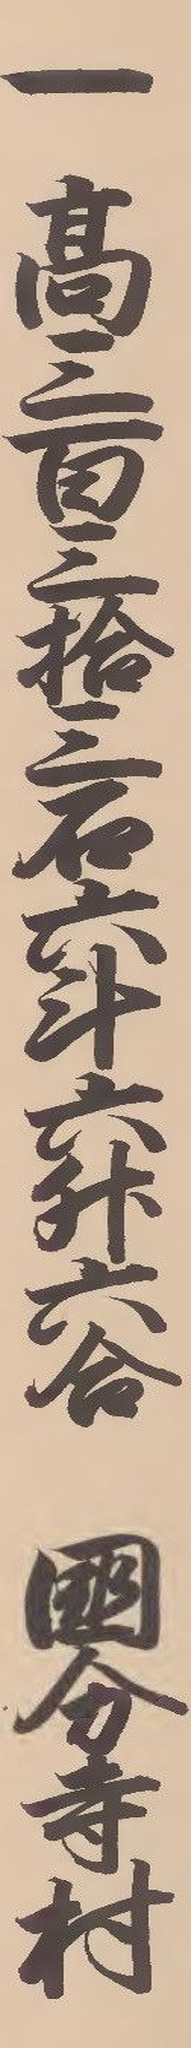一高三百三拾三石六斗六升六合国分寺村
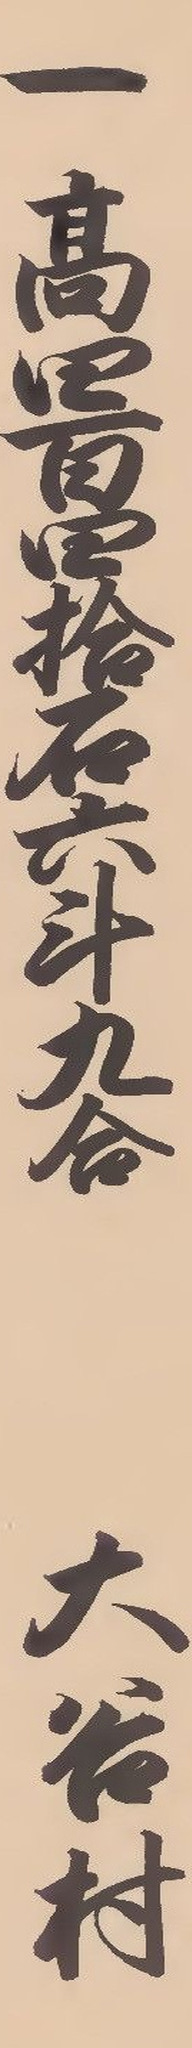一高四百四拾石六斗九合大谷村
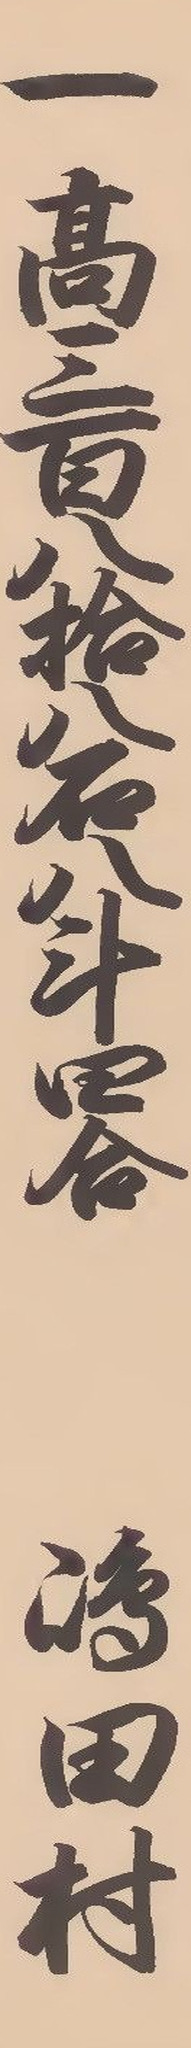一高三百八拾八石八斗四合嶋田村
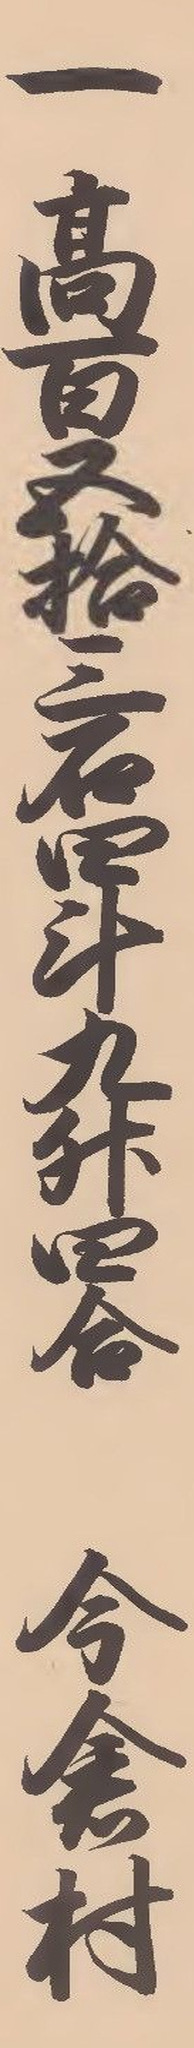一高百五拾三石四斗九升四合今倉村

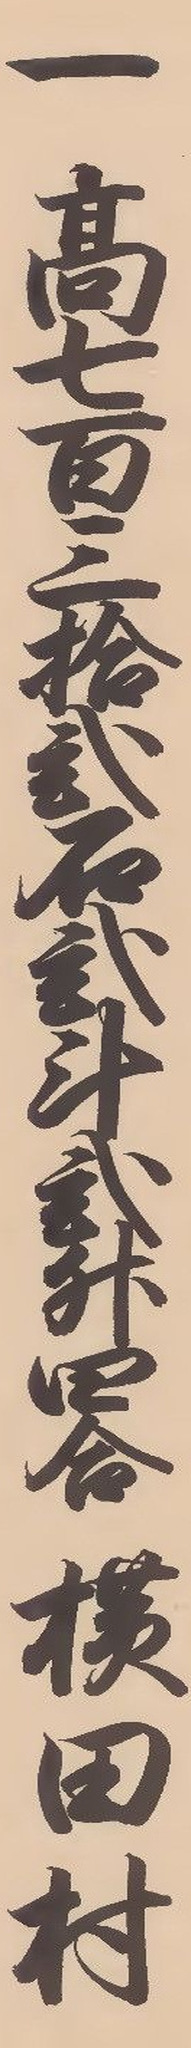一高七百三拾弐石弐斗弐升四合横田村
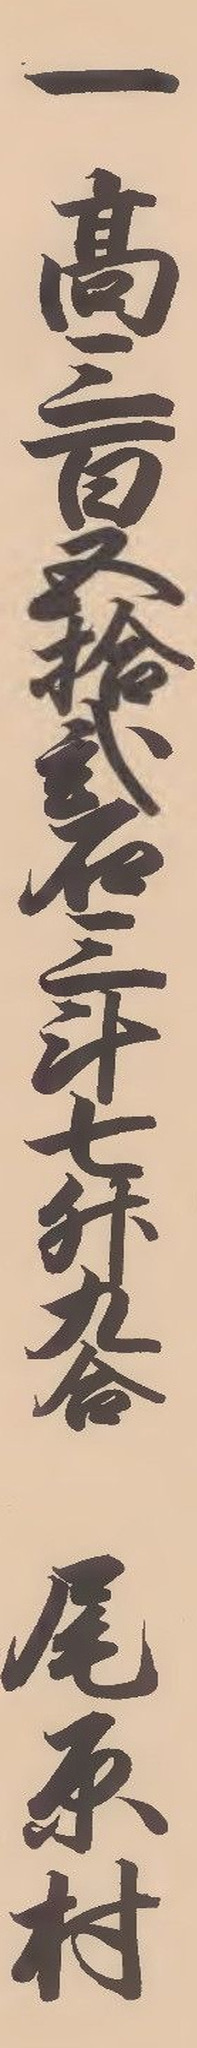一高三百五拾弐石三斗七升九合尾原村
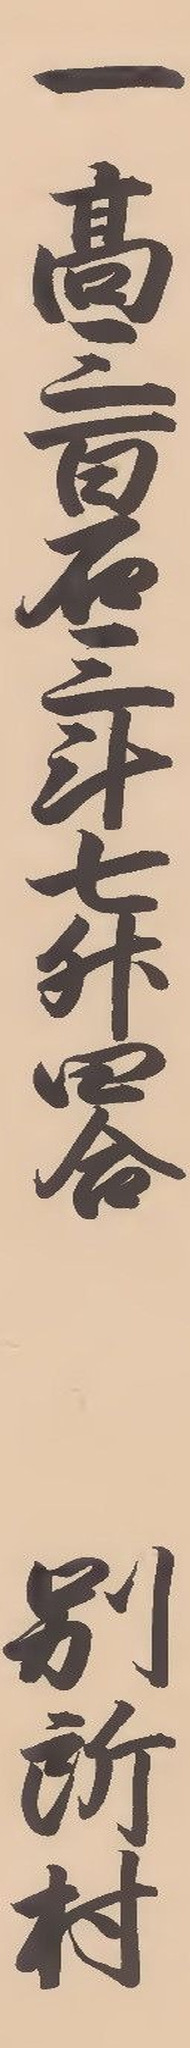一高三百石三斗七升四合別所村
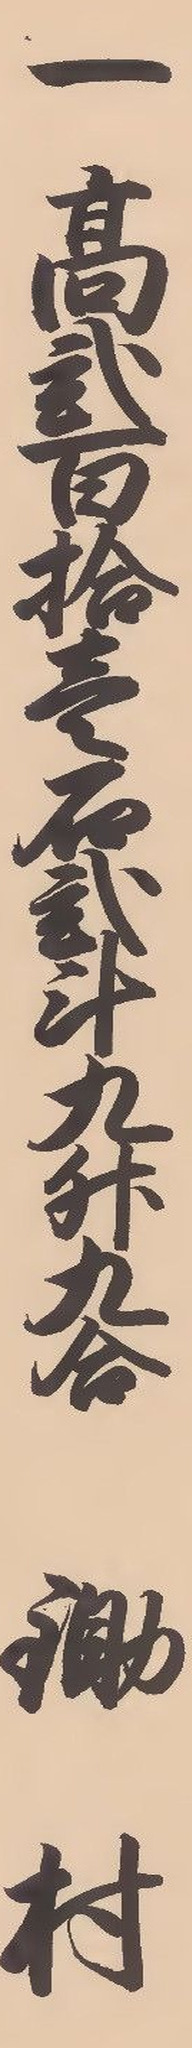一高弐百拾壱石弐斗九升九合鋤村
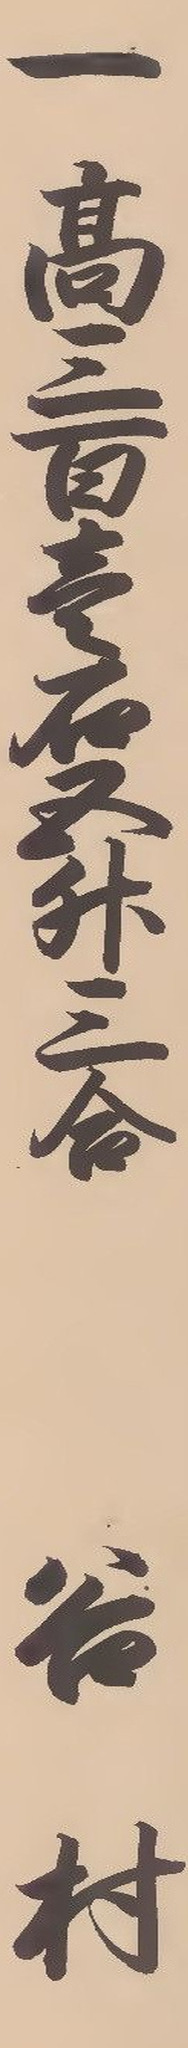一高三百壱石五升三合谷村
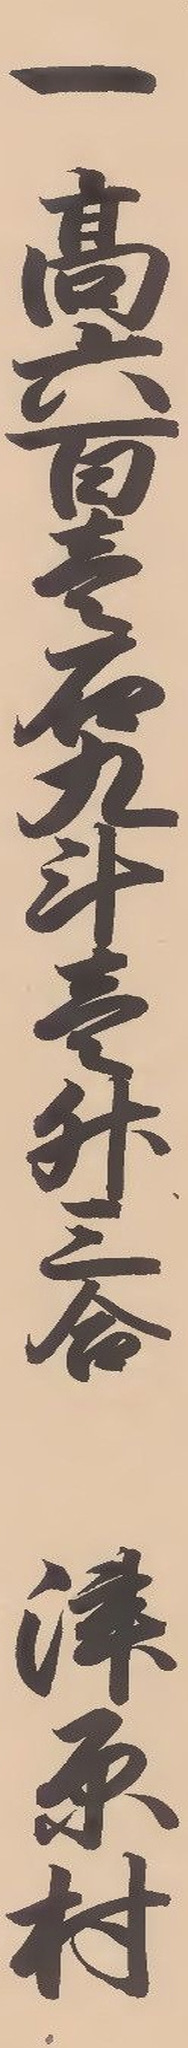一高六百壱石九斗壱升三合津原村
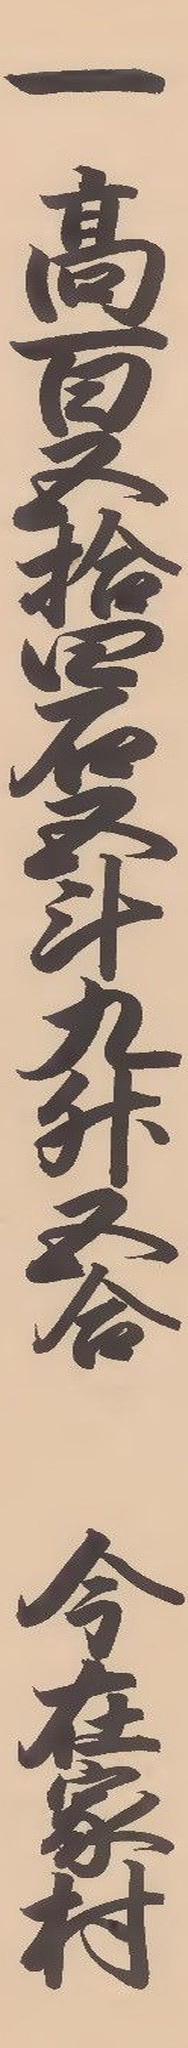一高百五拾四石五斗九升五合今在家村
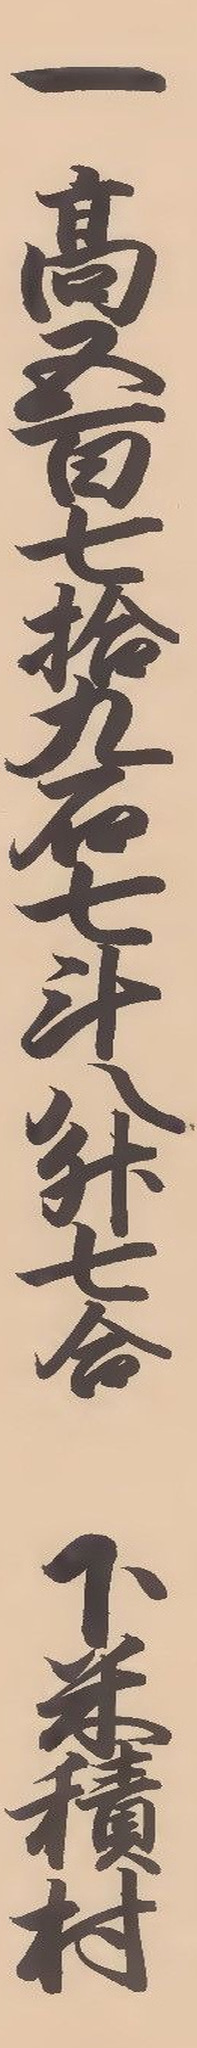一高五百七拾九石七斗八升七合下米積村

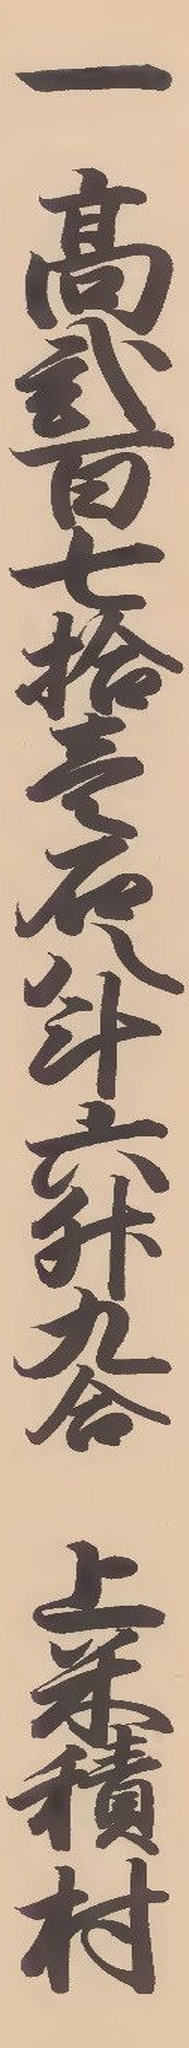一高弐百七拾壱石八斗六升九合上米積村
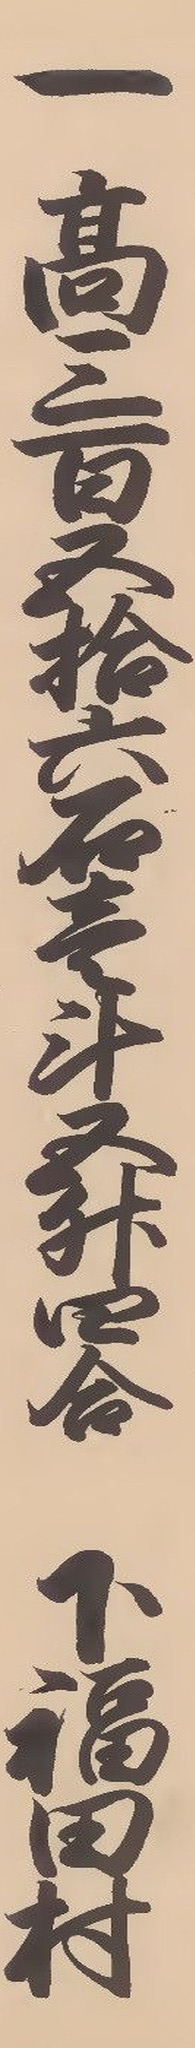一高三百五拾六石壱斗五升四合下福田村
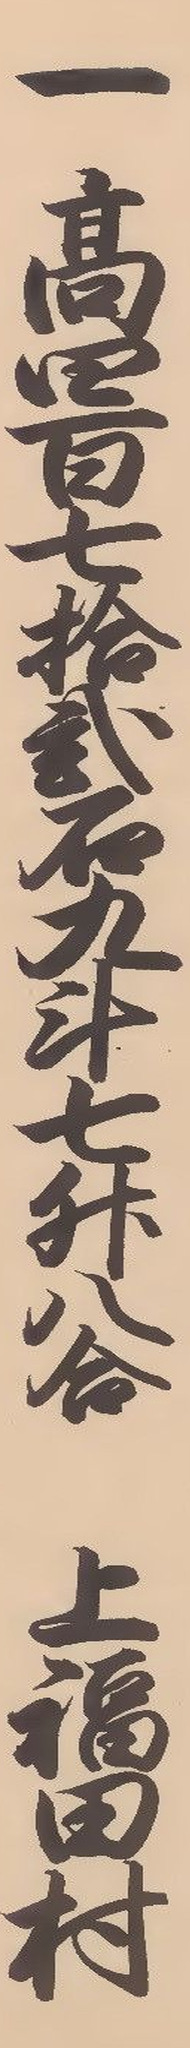一高四百七拾弐石九斗七升八合上福田村
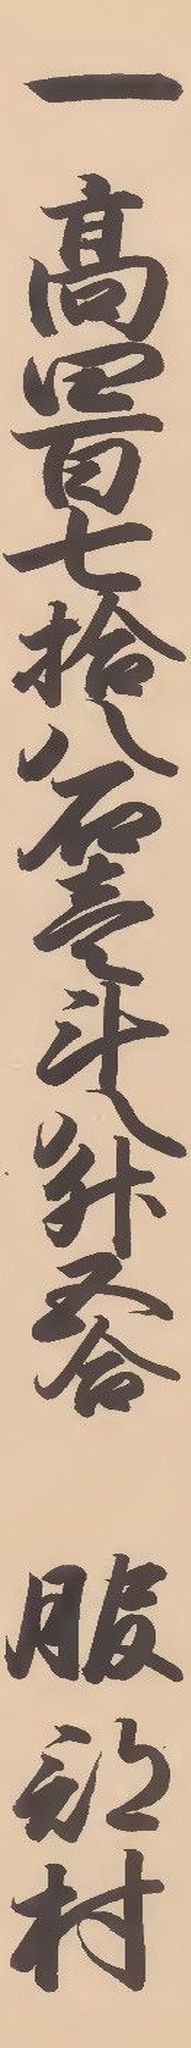一高四百七拾八石壱斗八升五合服部村
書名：伯耆国郷帳
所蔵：国立公文書館 National Archives of Japan
